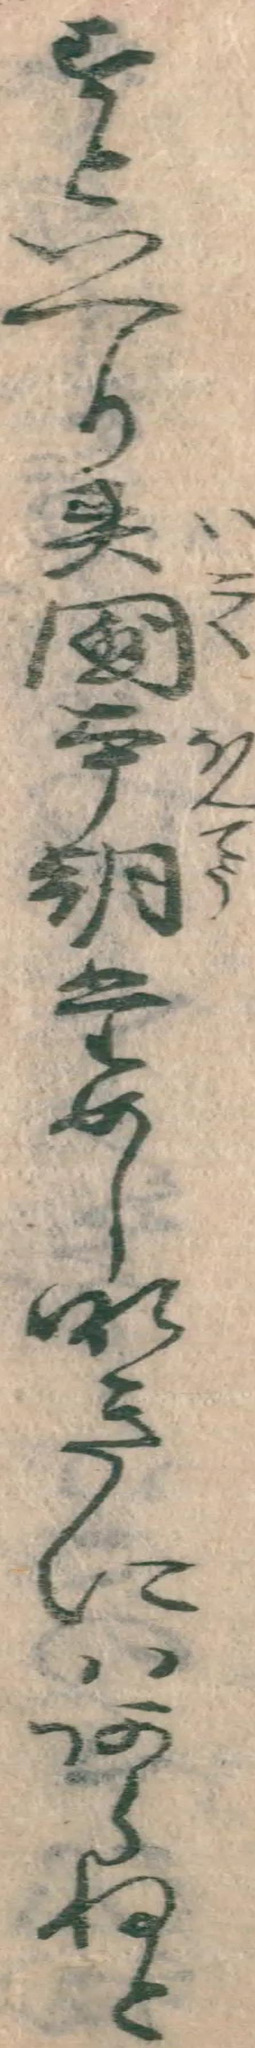すといへり異國本朝ためしなきにはあらねと
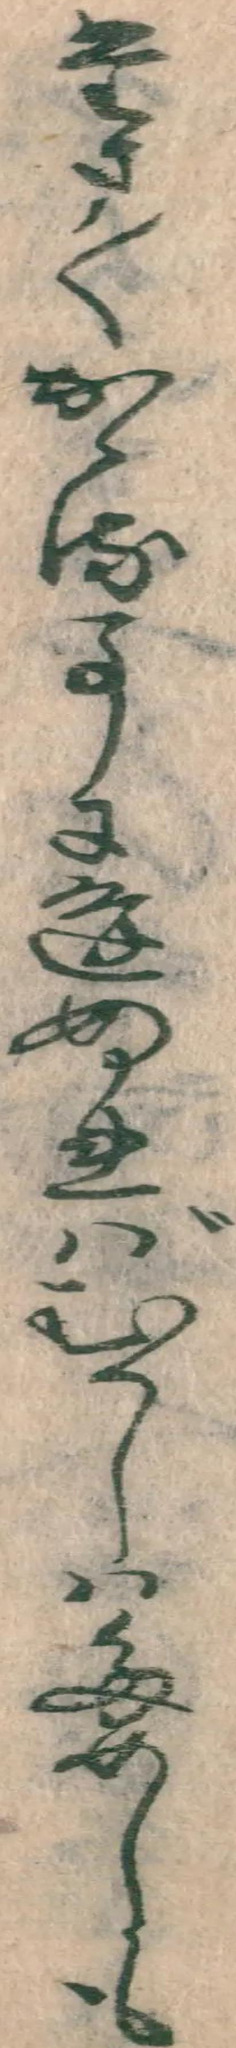たま〳〵かゝる事に逢ぬればむかしはためしも
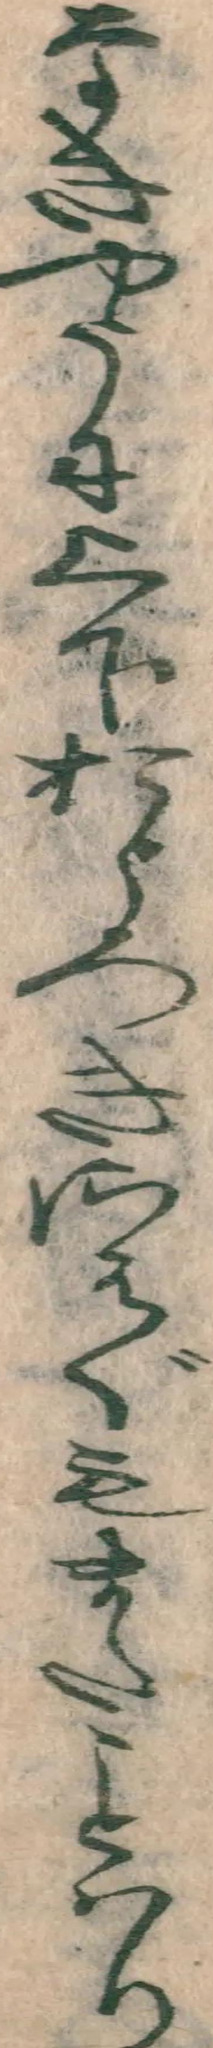なきやうに上下おとろきさはぐもまたことはり
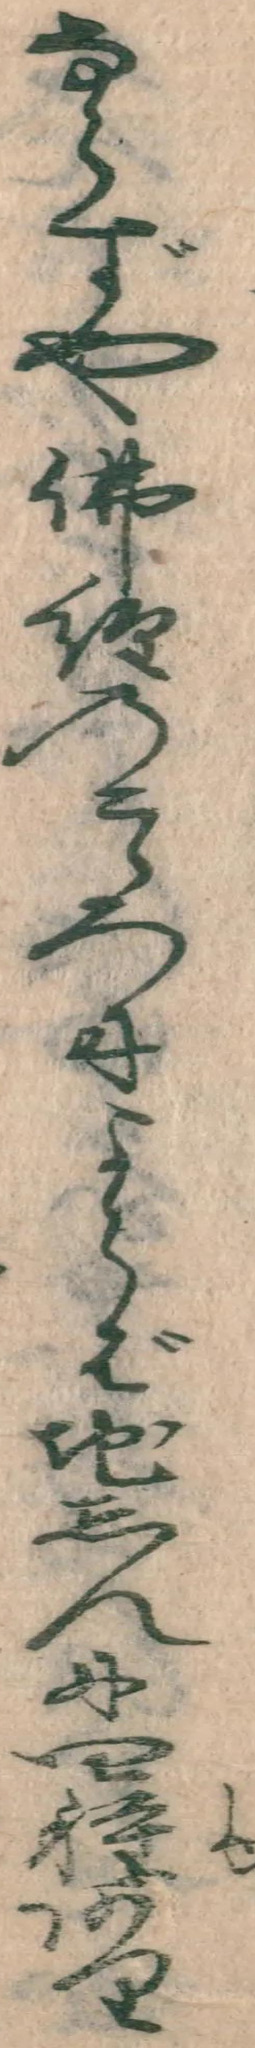ならずや佛経のこゝろによらば地しんに四種あり
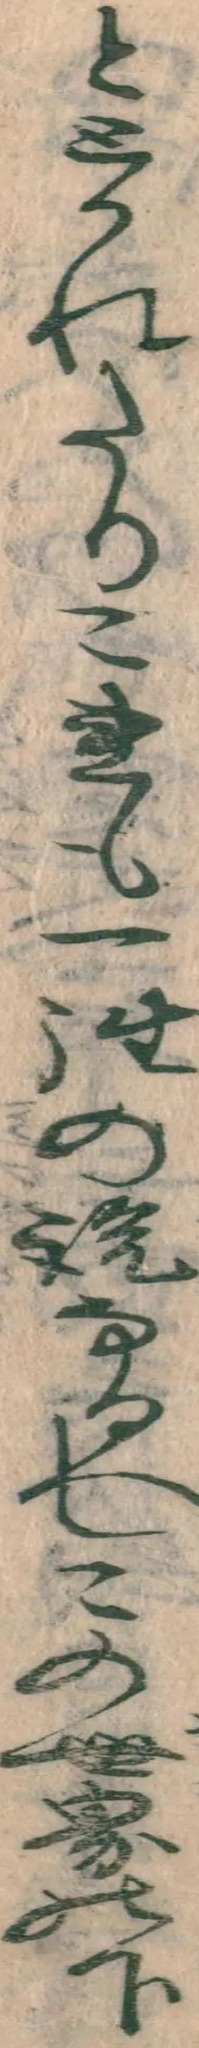ととかれたりこれも一往の説なるへしこの世界の下
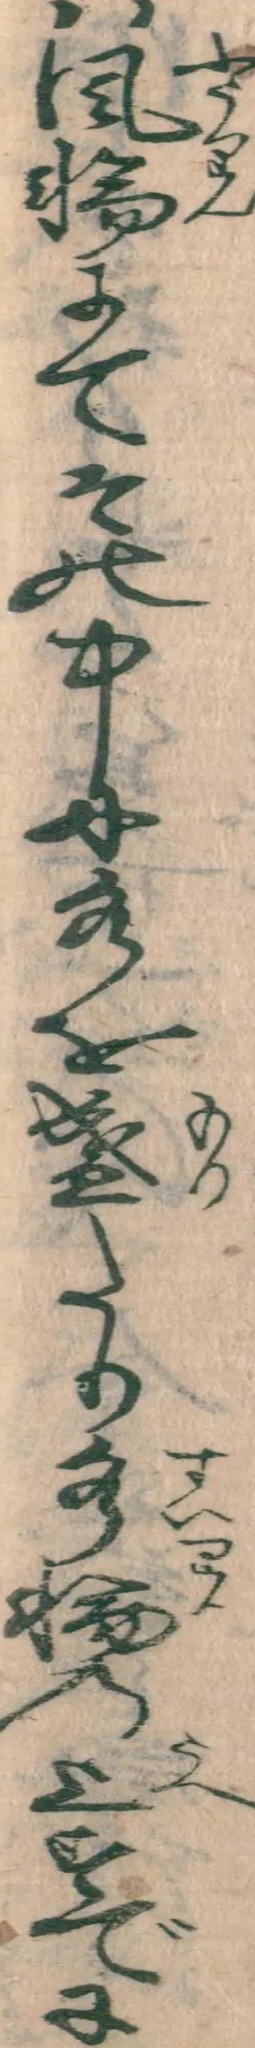は風輪にてその中に水を盛たり水輪の上すでに
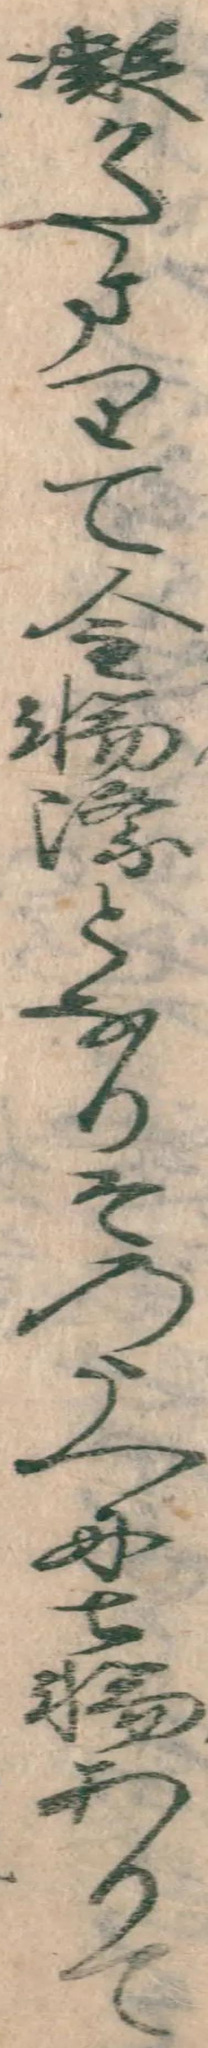凝かたまりて金輪際となりそのうへに土輪ありて
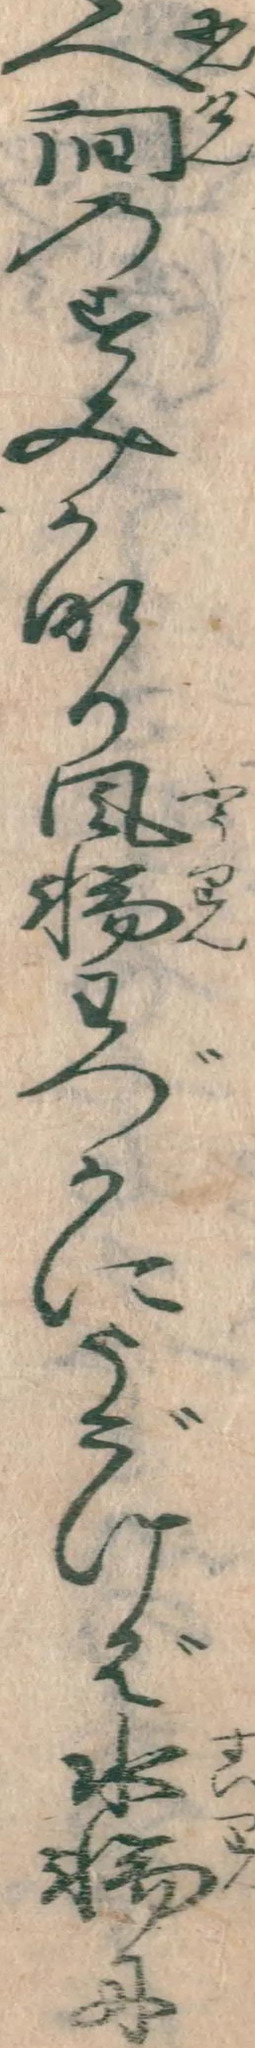人間のすみかなり風輪わづかにうごけば水輪に
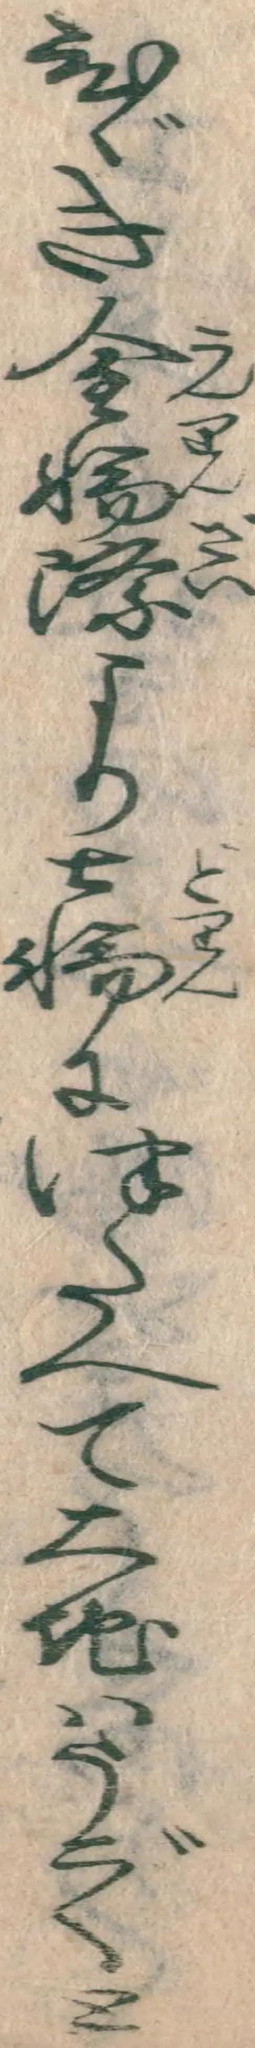ひゞき金輪際より土輪につたへて大地はうごくと
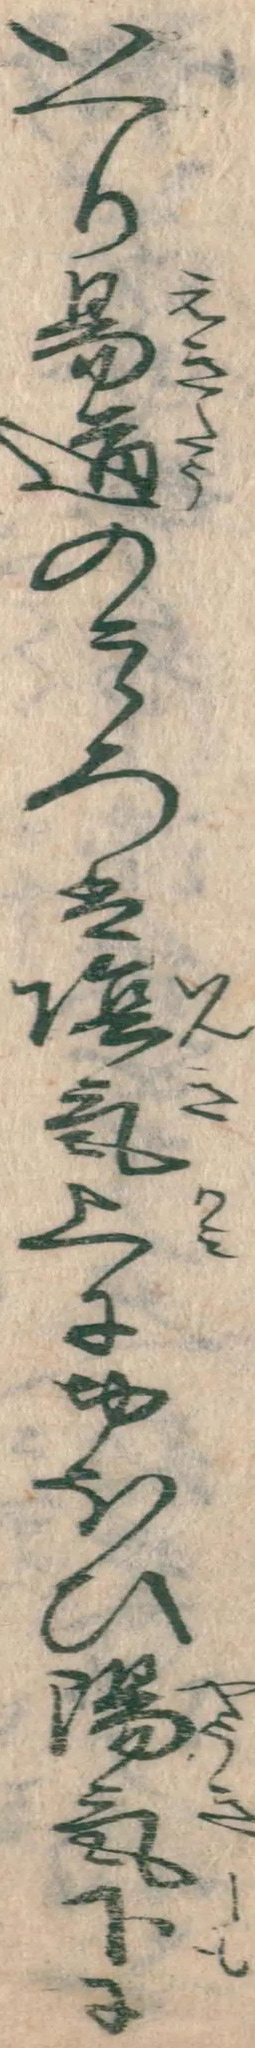いへり易道のこゝろは陰気上におほひ陽気下に
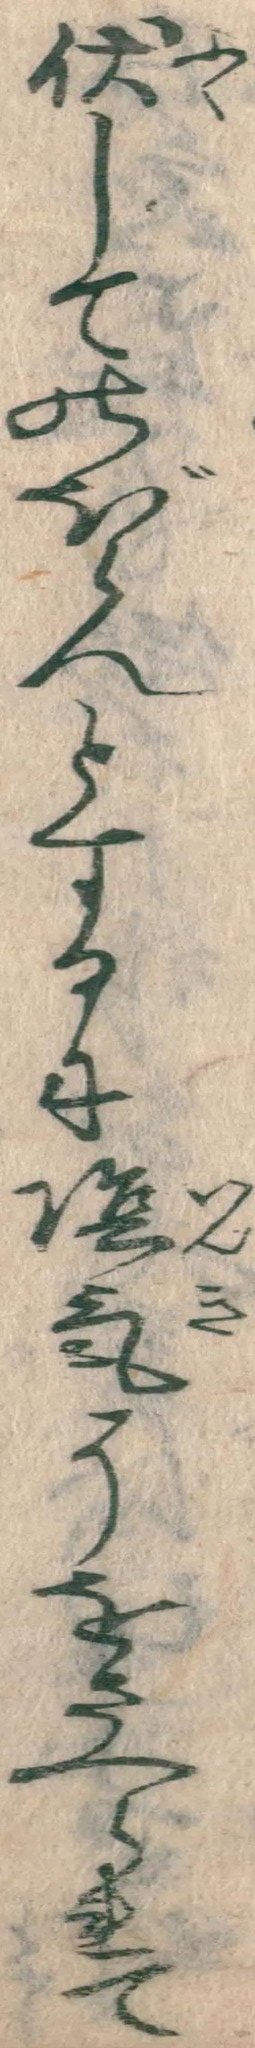伏してのぼらんとするに陰気にをさへられて
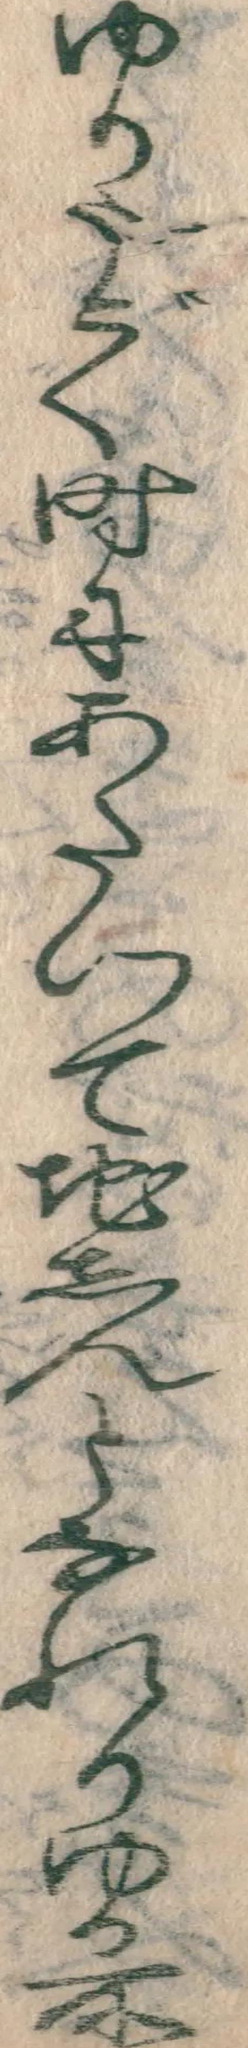ゆりうごく時にあたつて地しんとなれりゆる所
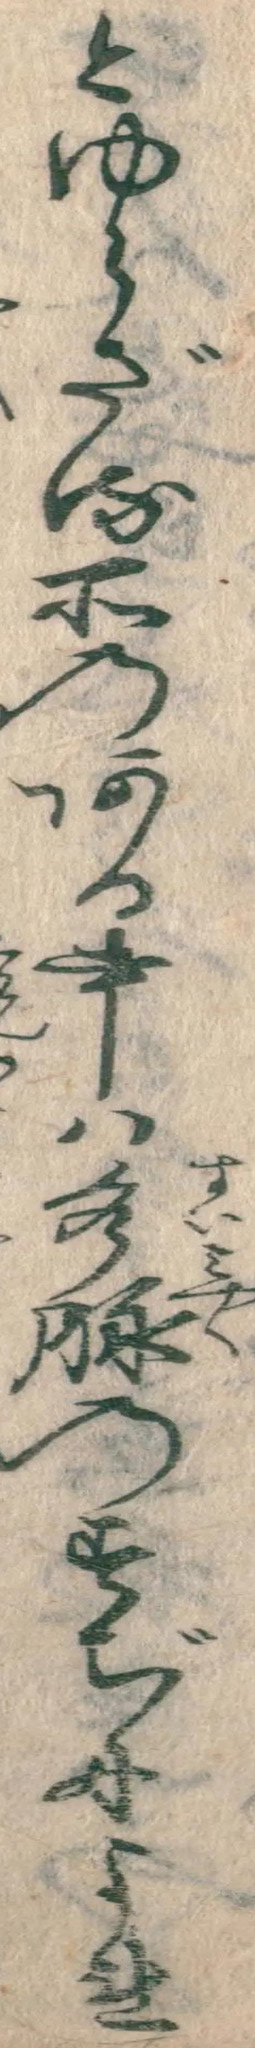とゆらざる所のある事は水脈のすぢによれ
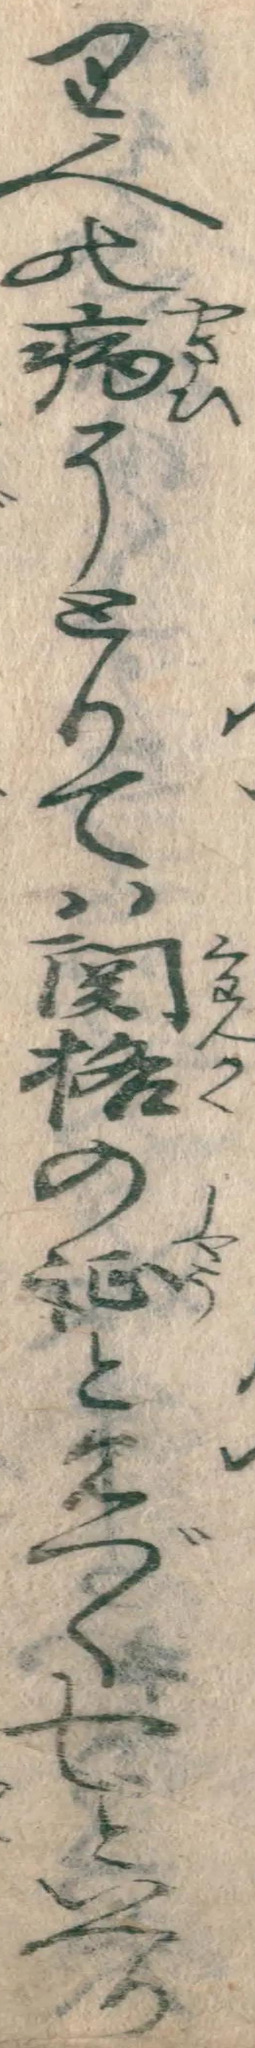り人の病にとりては関格の証と名づくへしといへり
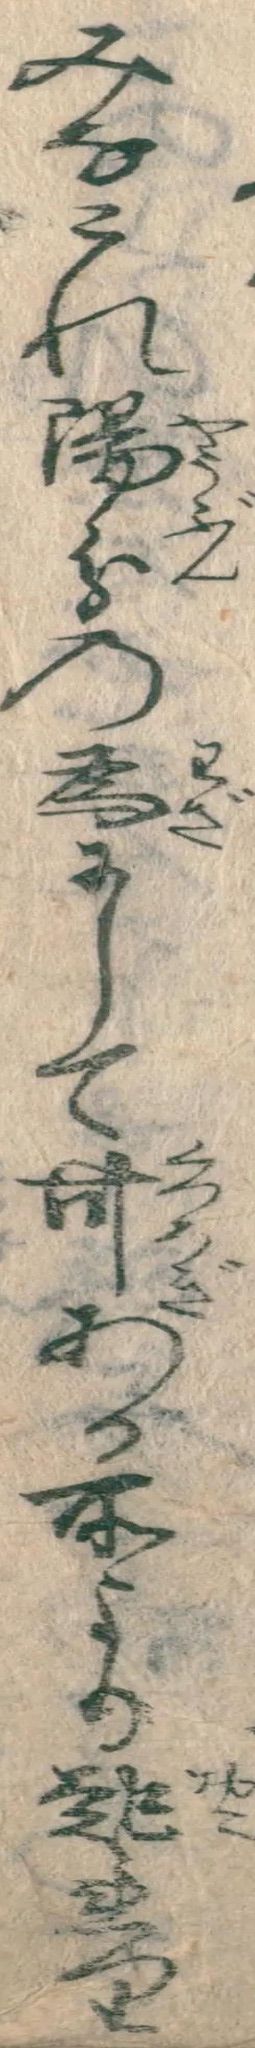みなこれ陽分の爲にしてある所より起れり
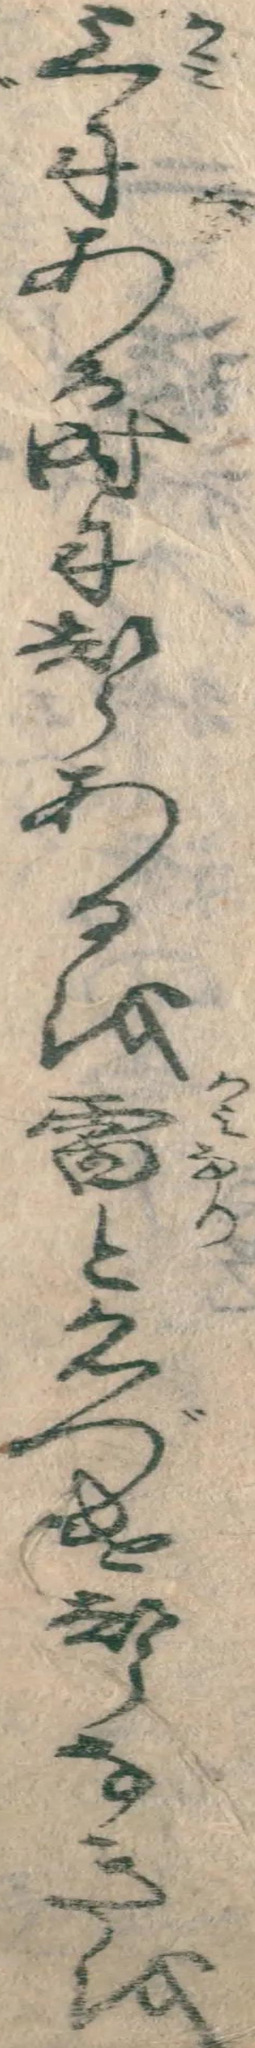上にある時に聲あるを雷と名づけ聲なきを
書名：艱難目異志. 上,下
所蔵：国立国会図書館 National Diet Library, JAPAN
